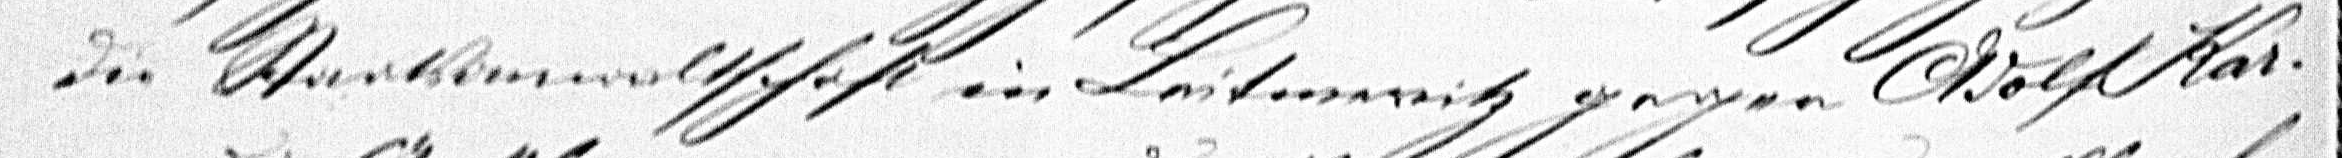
die Staatsanwaltschaft in Leitmaritz gegen Adolf Kar¬
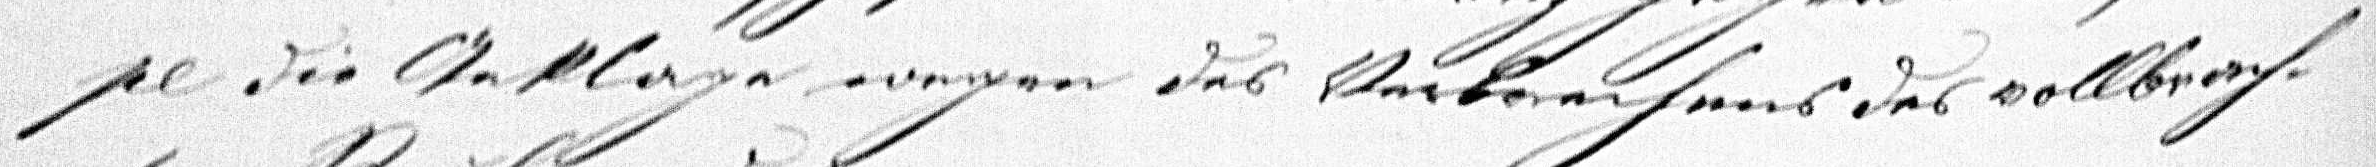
pe die Anklage wegen des Verbrechens des vollbrach¬
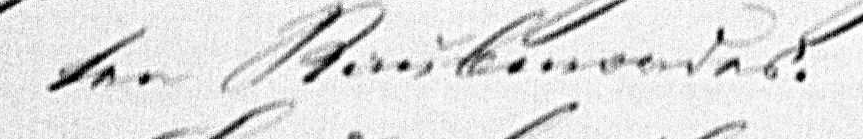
ten Raubmordes:
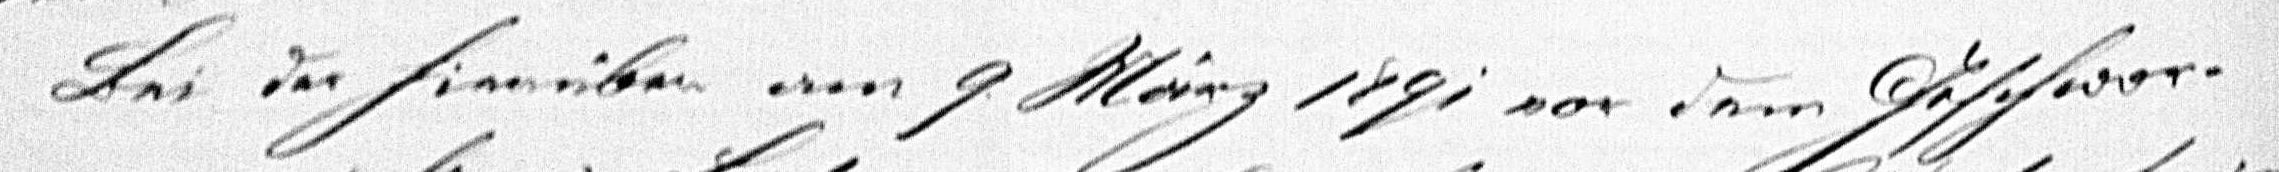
Bei der hierüber am 9. März 1891 vor dem Geschwor¬
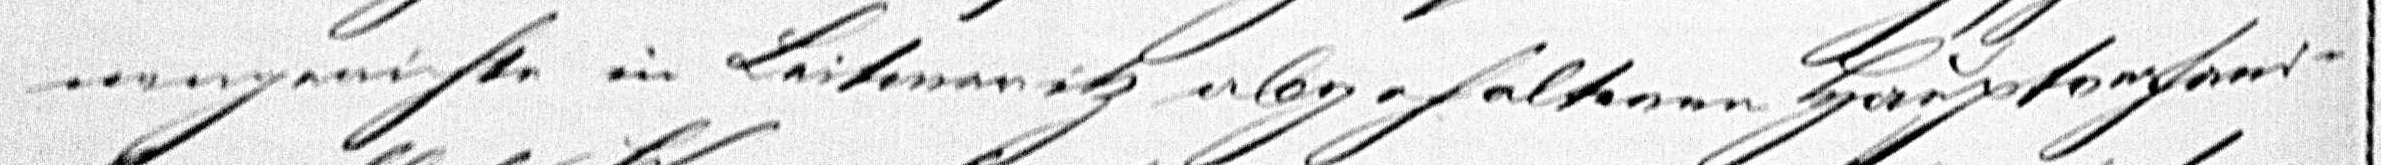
negerichte in Leitmaritz abgehaltenen Hauptverhand¬
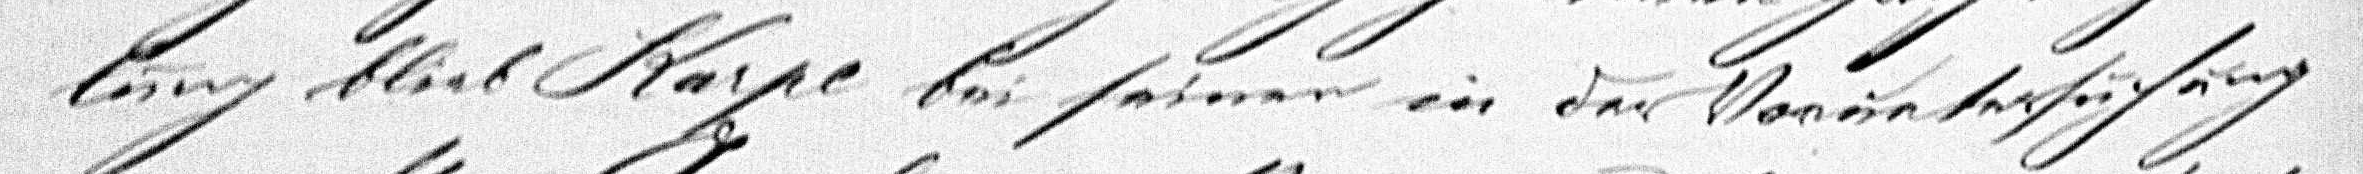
lung blieb Karpe bei seiner in der Voruntersuchung
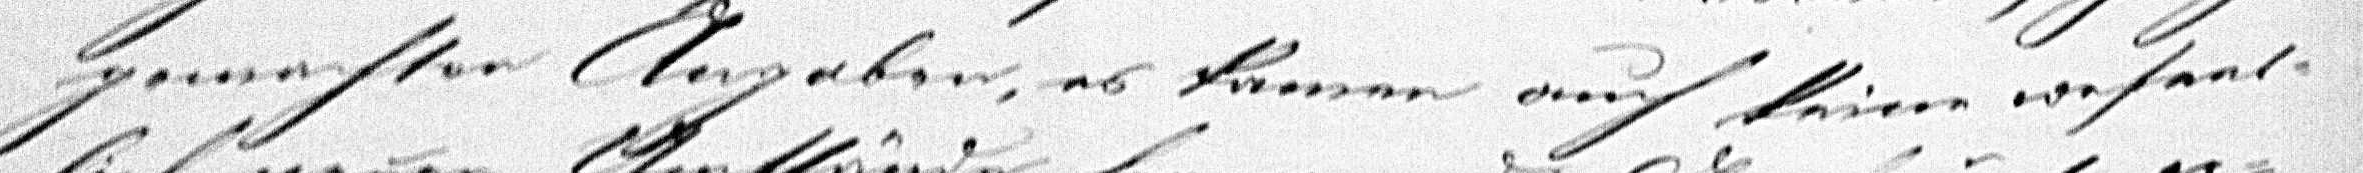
gemachten Angaben, es kamen auch keine wesent¬
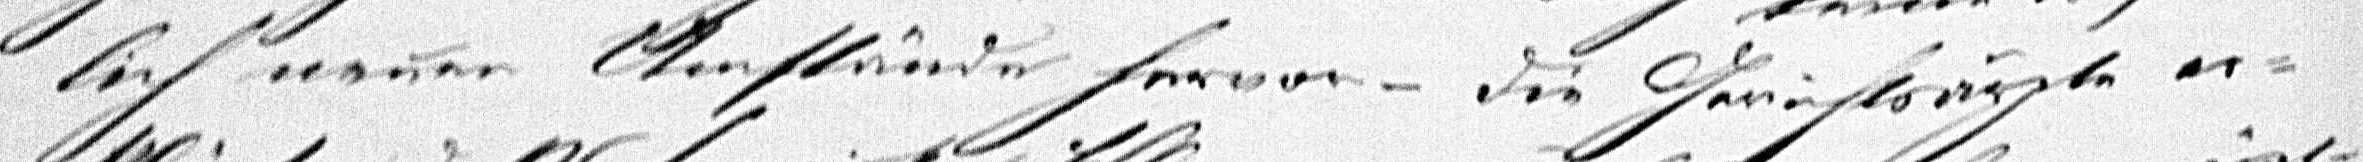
lich neuen Umstände hervor – die Gerichtsärzte er¬
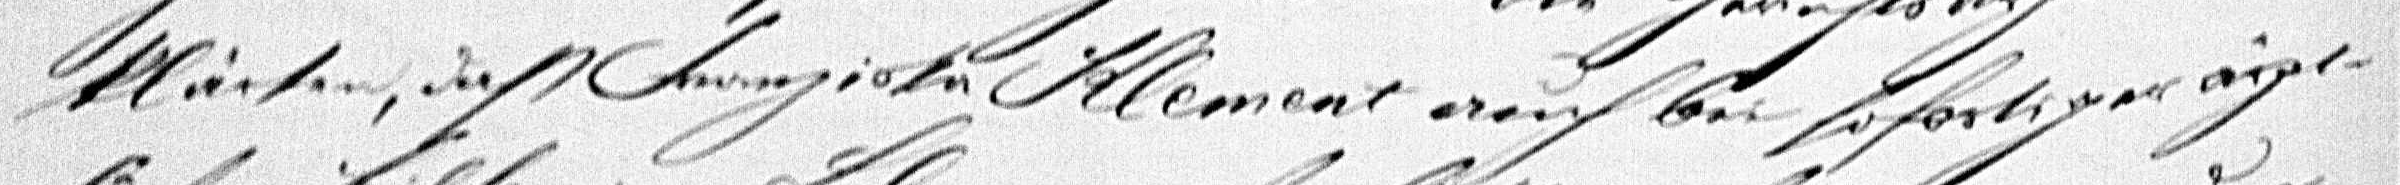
klärten, daß Franziska Klement auch bei sofortiger ärzt¬
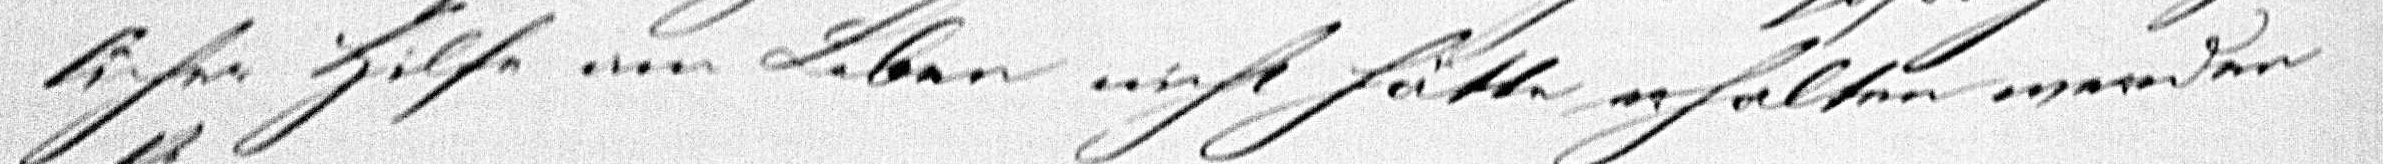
licher Hilfe am Leben nicht hätte erhalten werden
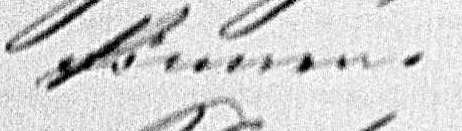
können.
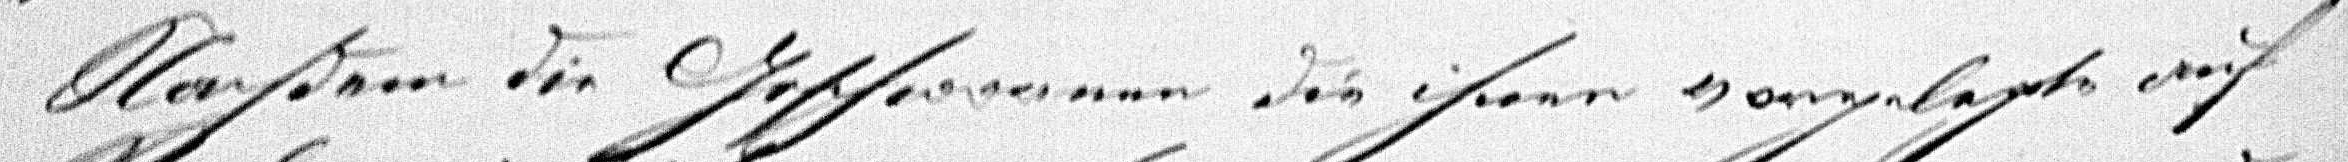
Nachdem die Geschworenen, die ihnen vorgelegte auf
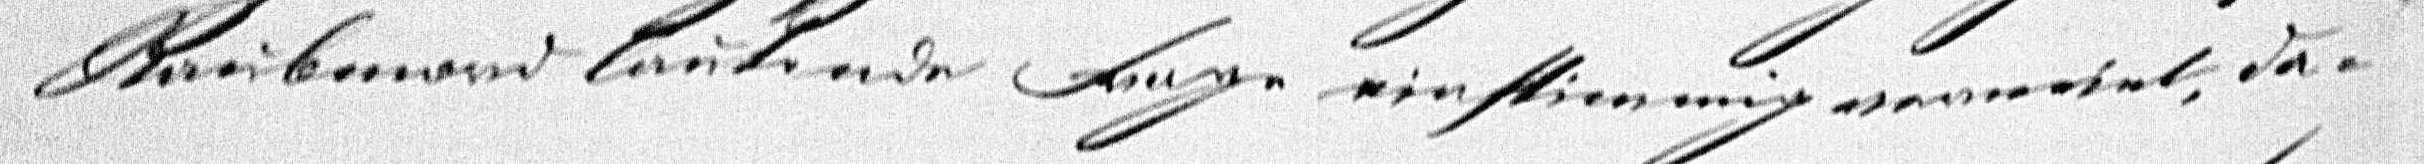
int, da Raubmord lautende Frage einstimmig verneint, da¬
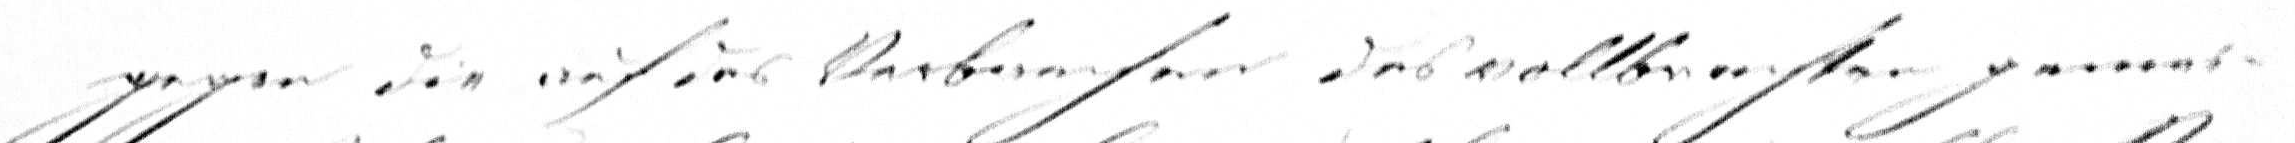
gegen die auf das Verbrechen des volbrachten gemei¬
